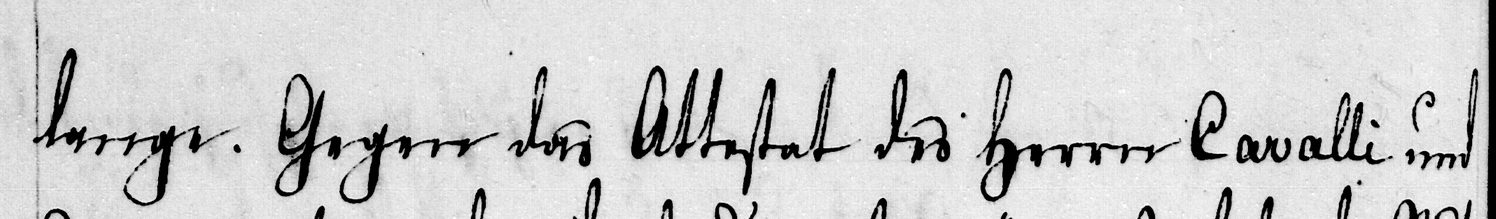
lange. Gegen das Attestat des Herrn Cavalli und
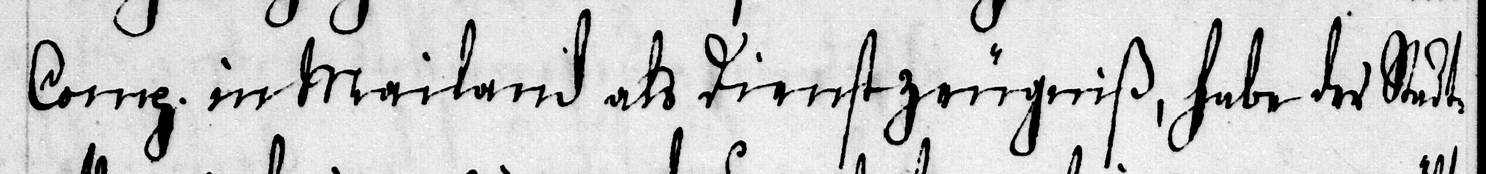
Comp. in Mailand als Dienstzeugniß, habe der Stad¬
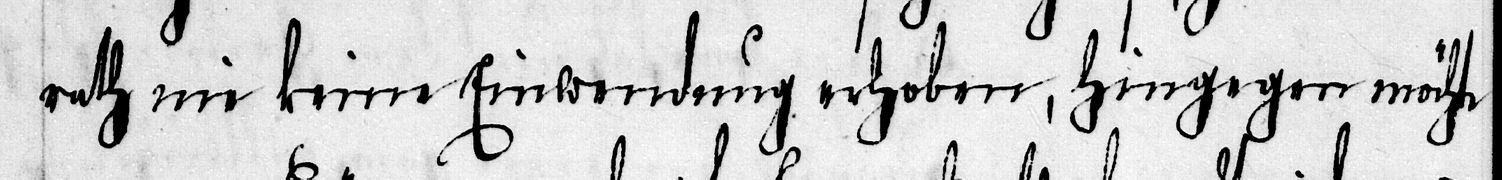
trath nie keine Einwendung erhoben, hingegen möchte
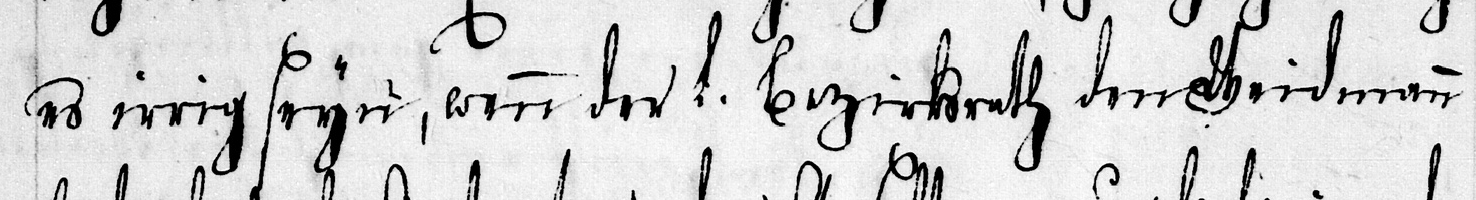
es irrig seyn, wenn der L. Bezirksrath den Weidmann
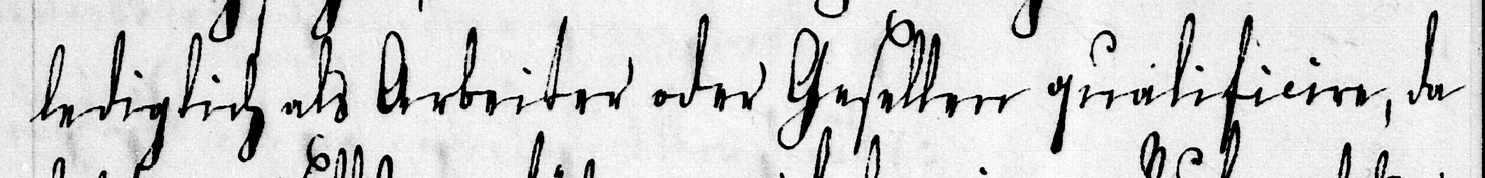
lediglich als Arbeiter oder Gesellen qualificire, da
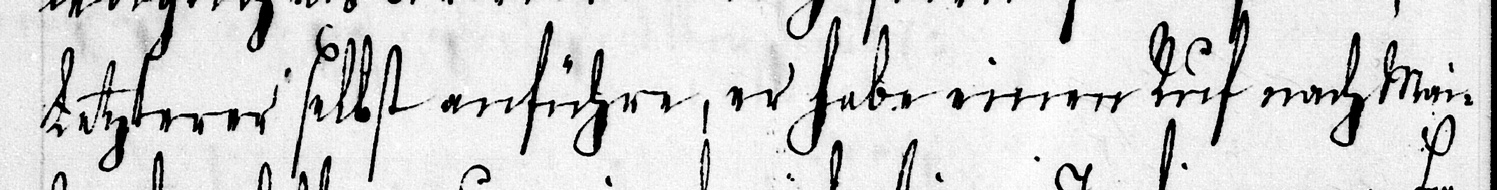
Letzterer selbst anführe, er habe einen Ruf nach Mai¬
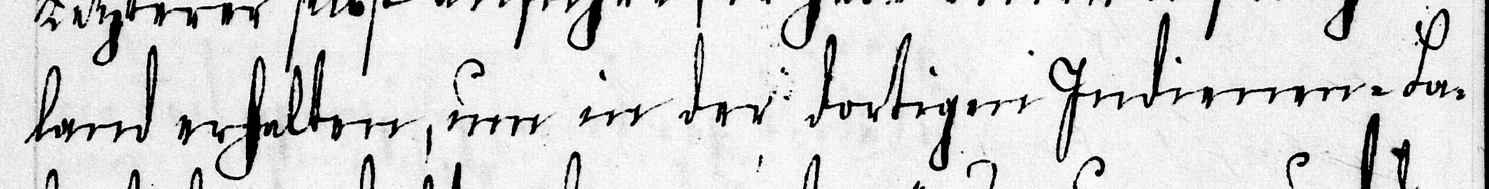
land erhalten, um in der dortigen Indienen-Fa¬
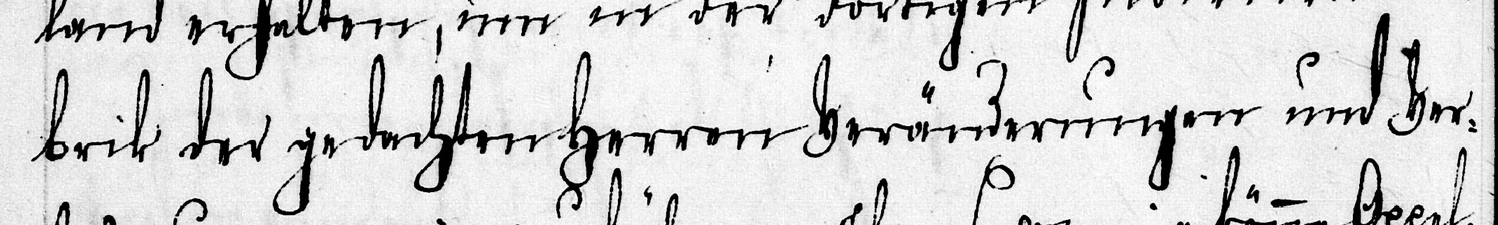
brik der gedachten Herren Veränderungen und Ver¬
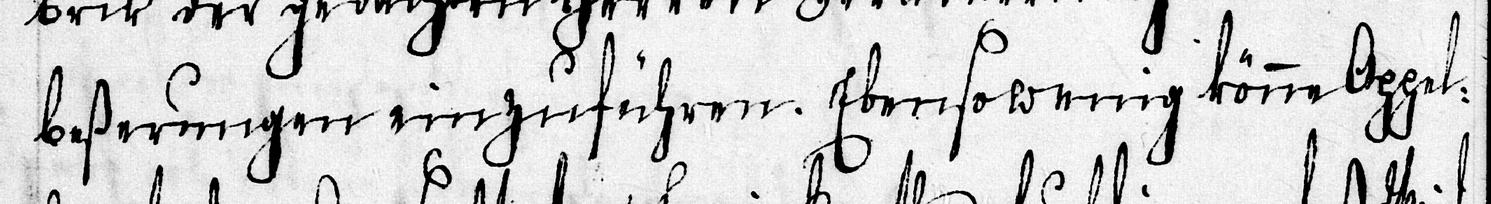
beßerungen einzuführen. Ebensowenig könne Appel¬
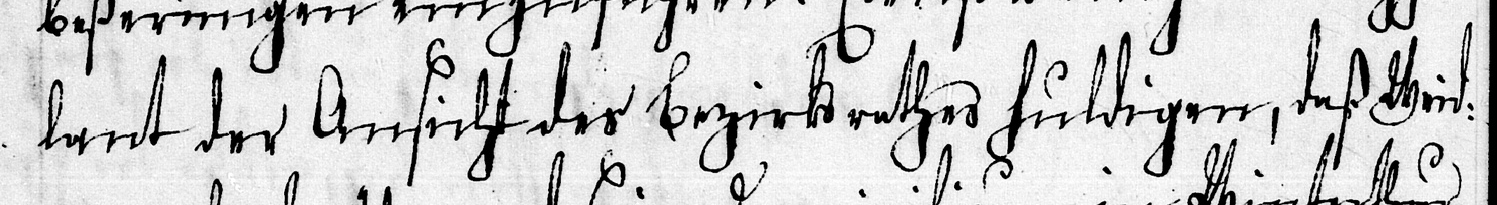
lant der Ansicht des Bezirksrathes huldigen, daß Weid¬
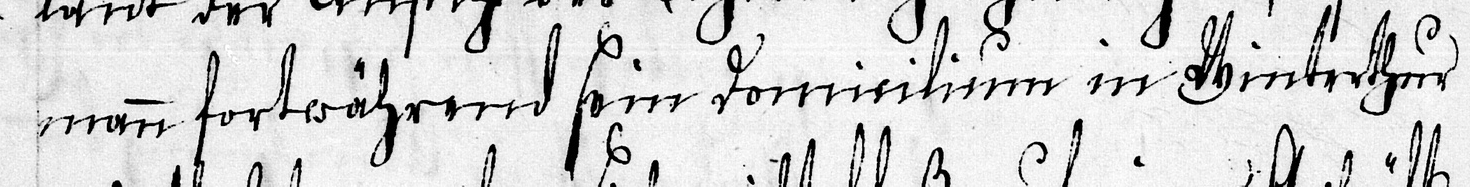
mann fortwährend sein Domicilium in Winterthur
